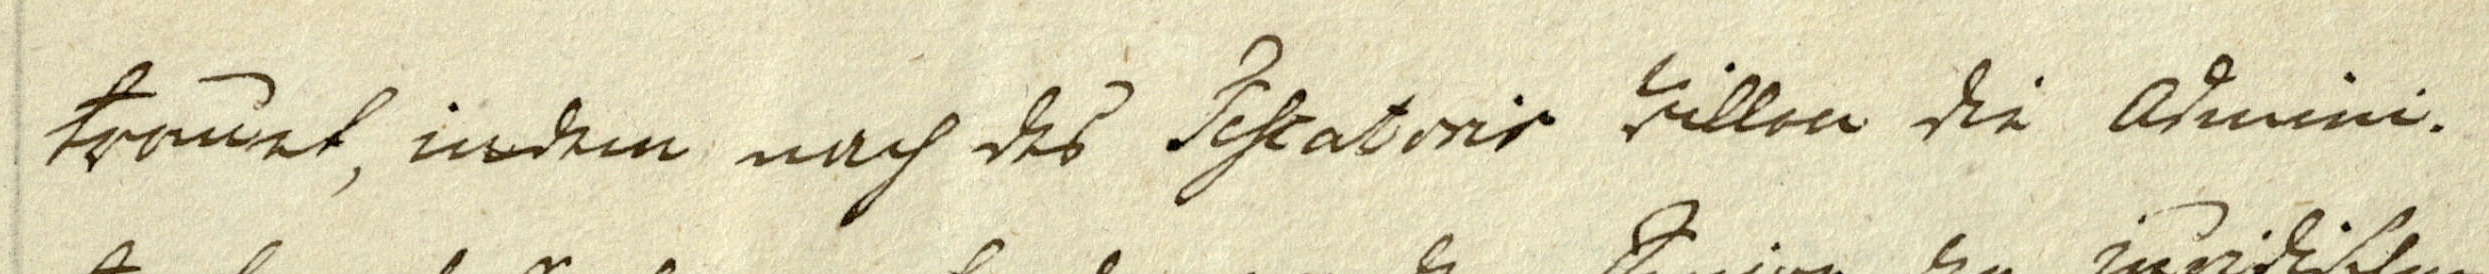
trauet, indem nach des Testatoris Willen die Admini¬
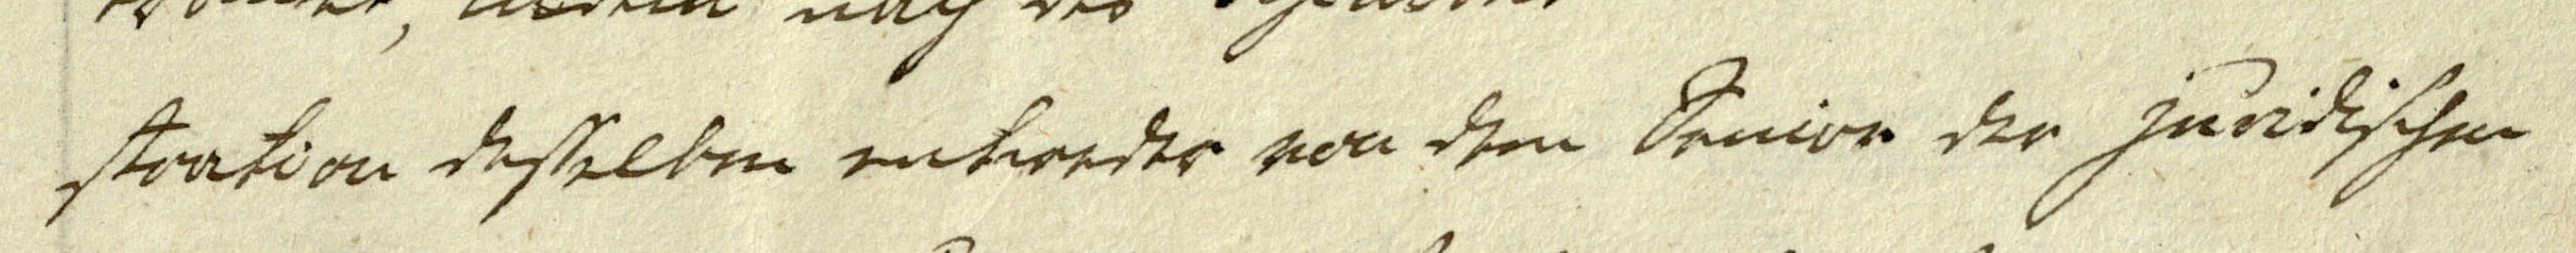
stration desselben entweder von dem Senior der juridischen
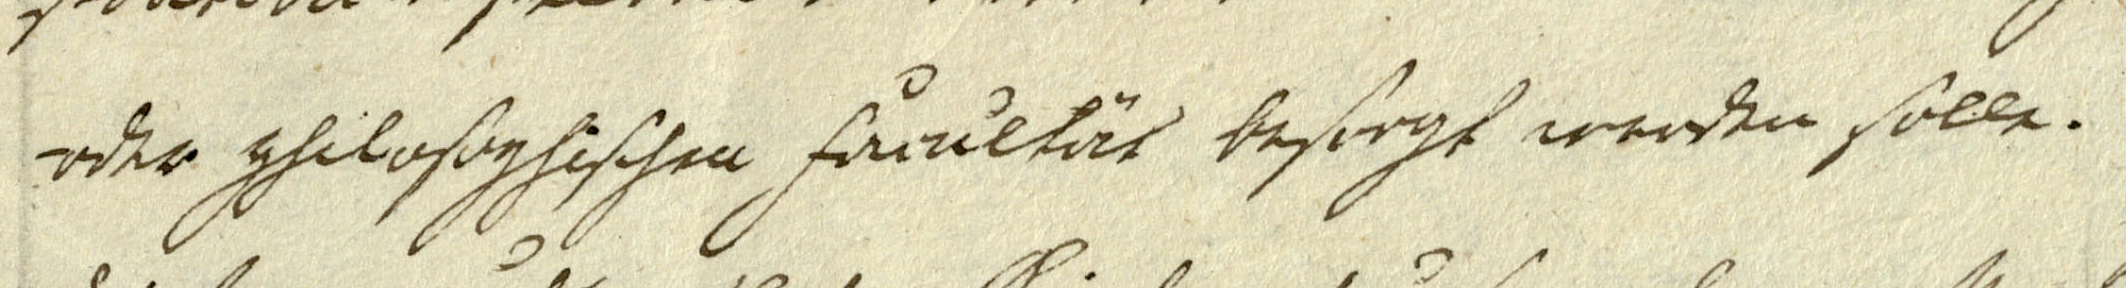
der philosophischen Facultät besorgt werden solle.
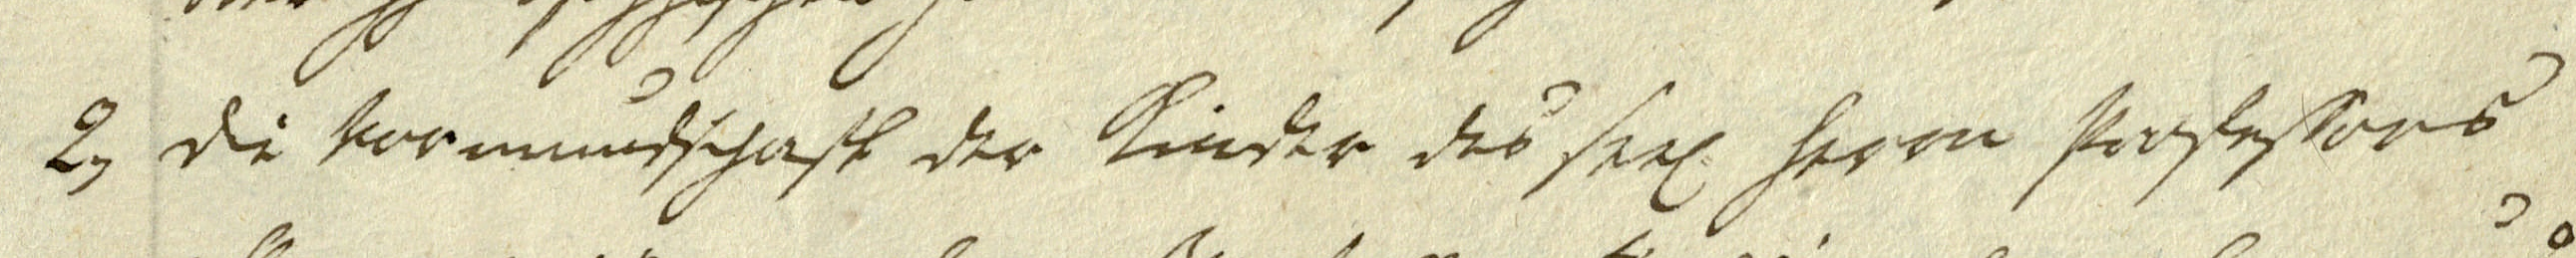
2., die Vormundschaft der Kinder des seel. Herrn Professors
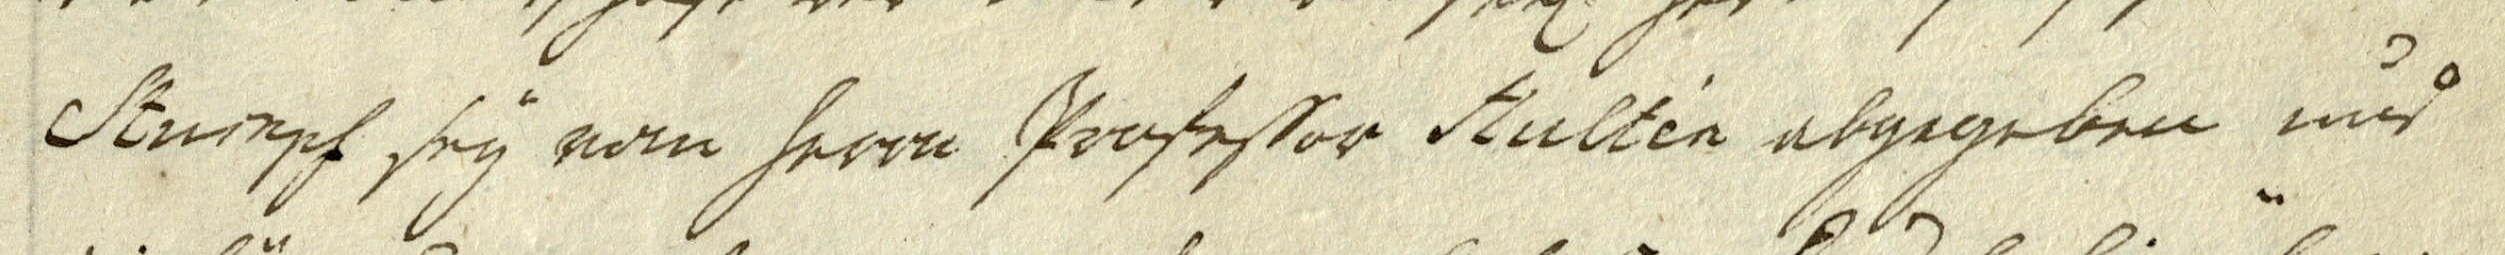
Stumpf seÿ vom Herrn Professor Hultén abgegeben und
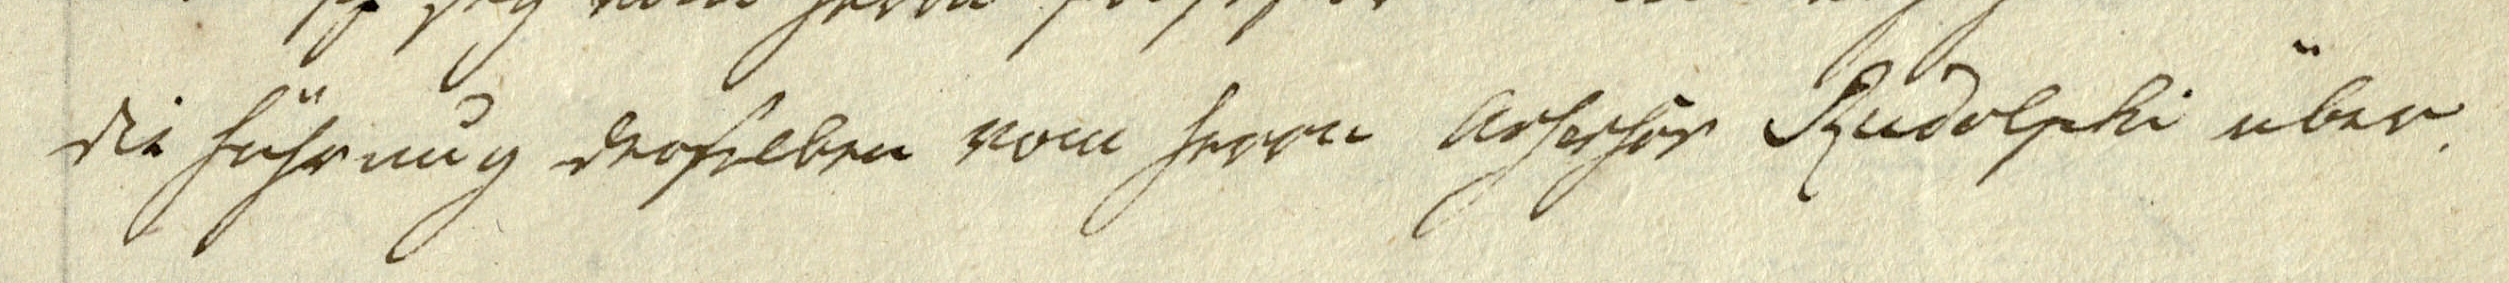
die Führung derselben vom Herrn Assessor Rudolphi über-
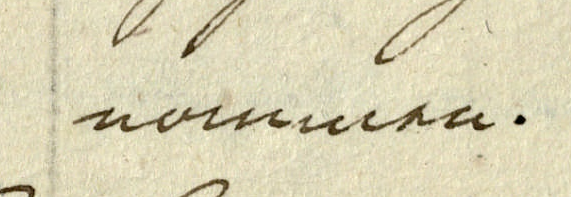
nommen.
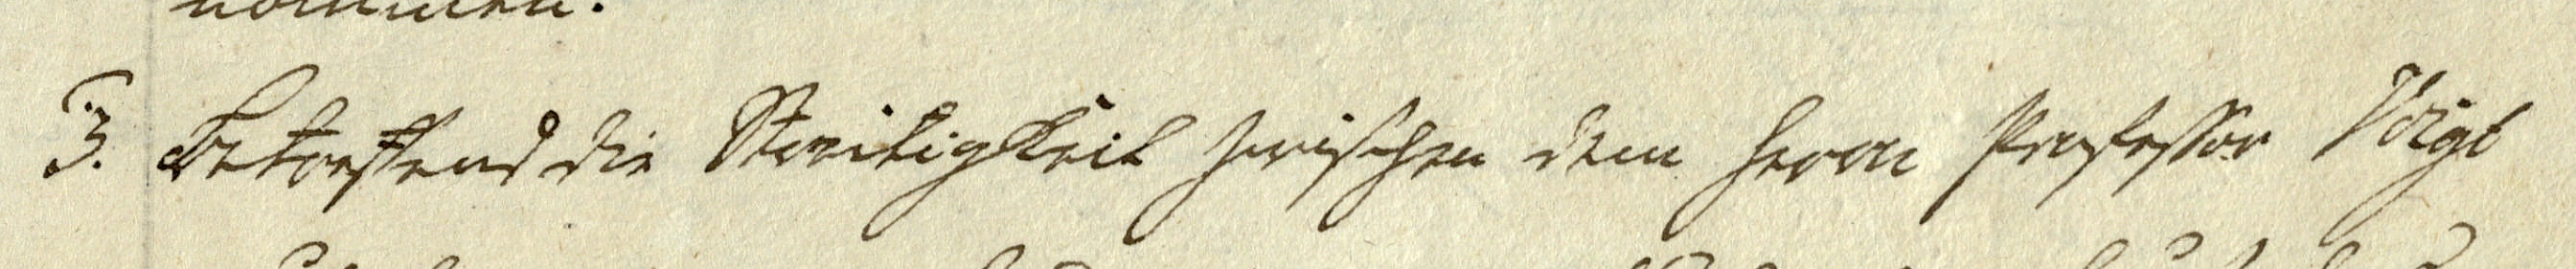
3. Betreffend die Streitigkeit zwischen dem Herrn Professor Voigt
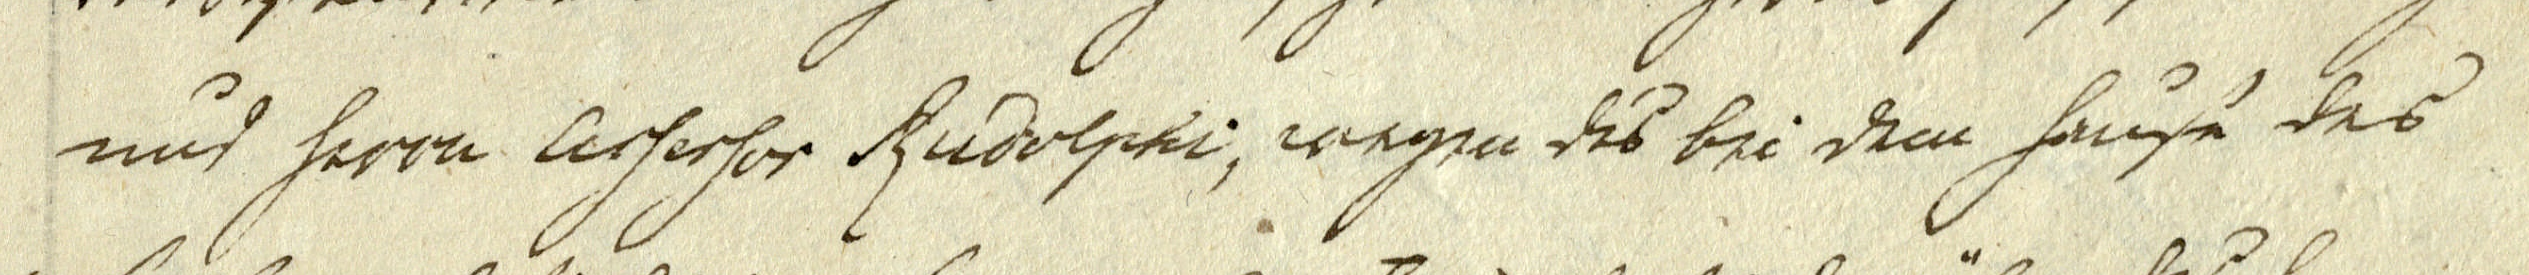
und Herrn Assessor Rudolphi, wegen des bei dem Hause des
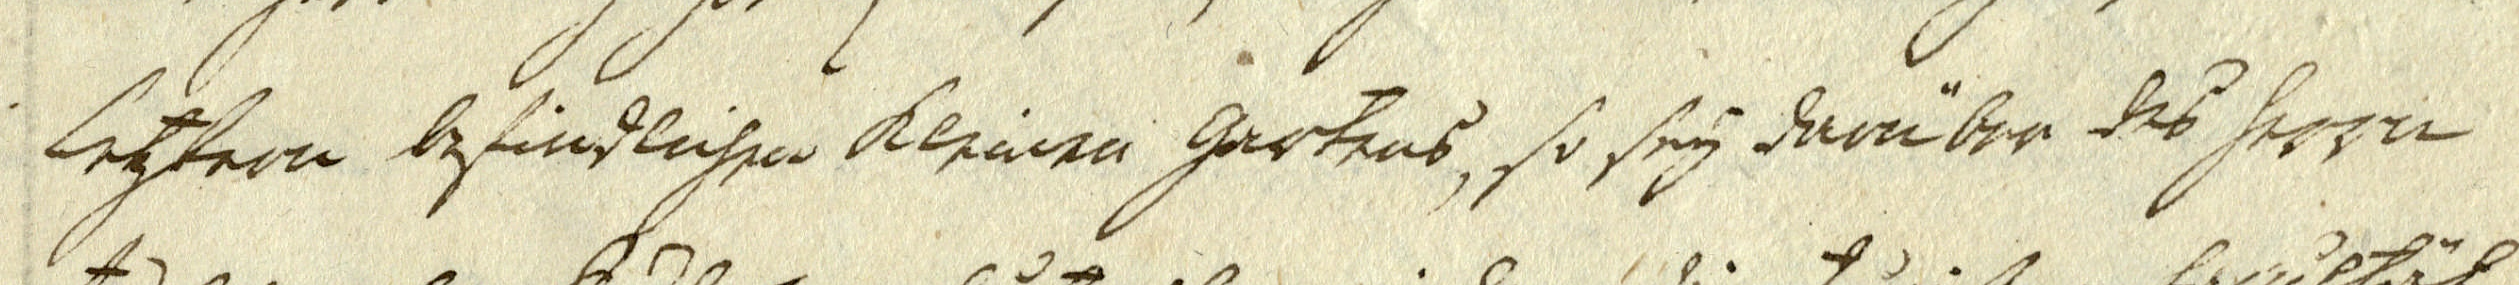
letztern befindlichen kleinen Gartens, so seÿ darüber des Herrn
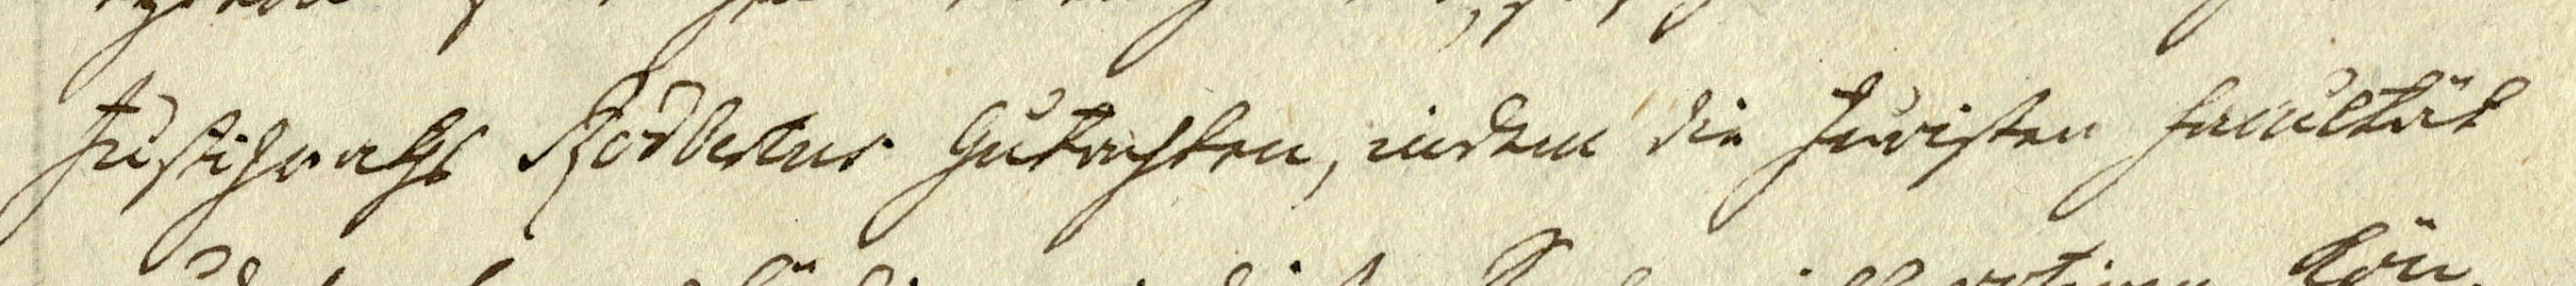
Justizraths Rodbertus Gutachten, indem die Juristen Facultät
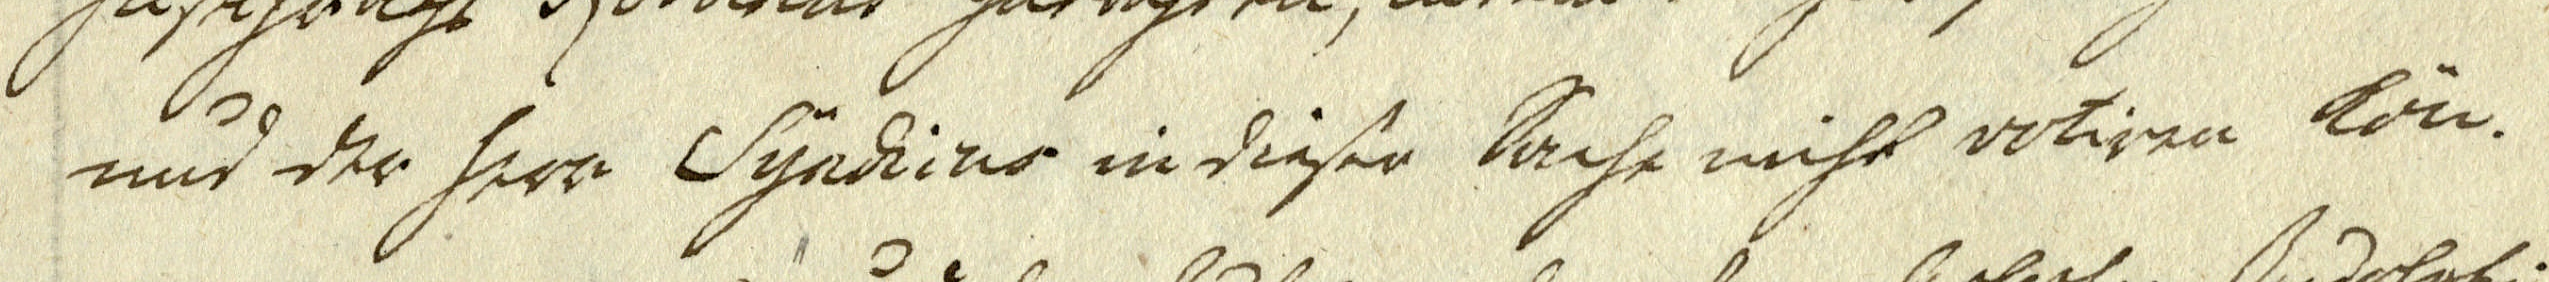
und der Herr Sÿndicus in dieser Sache nicht votiren kön¬
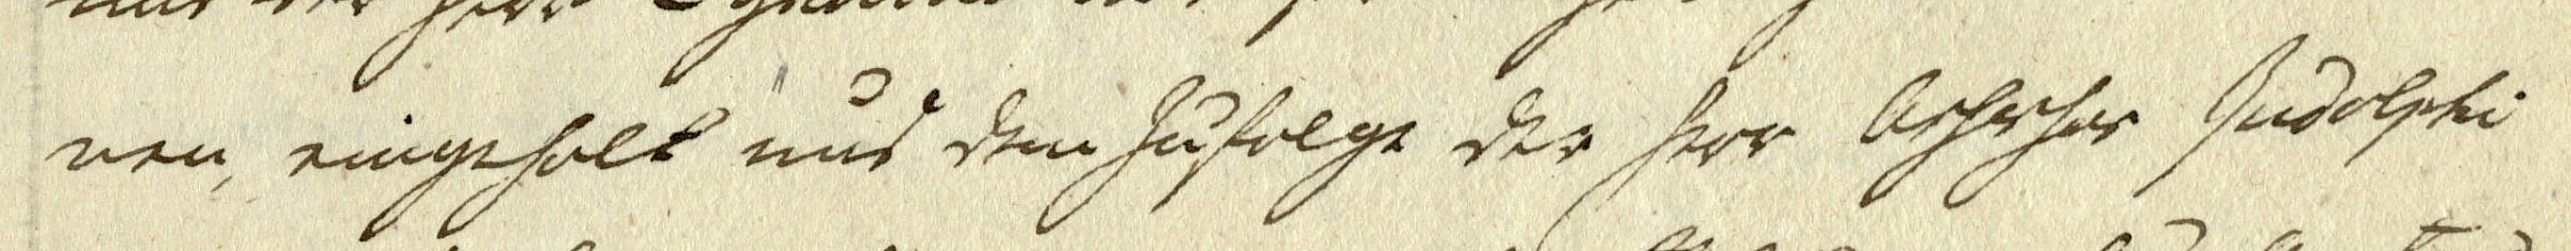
nen, eingeholt und dem Zufolge der Herr Assessor Rudolphi
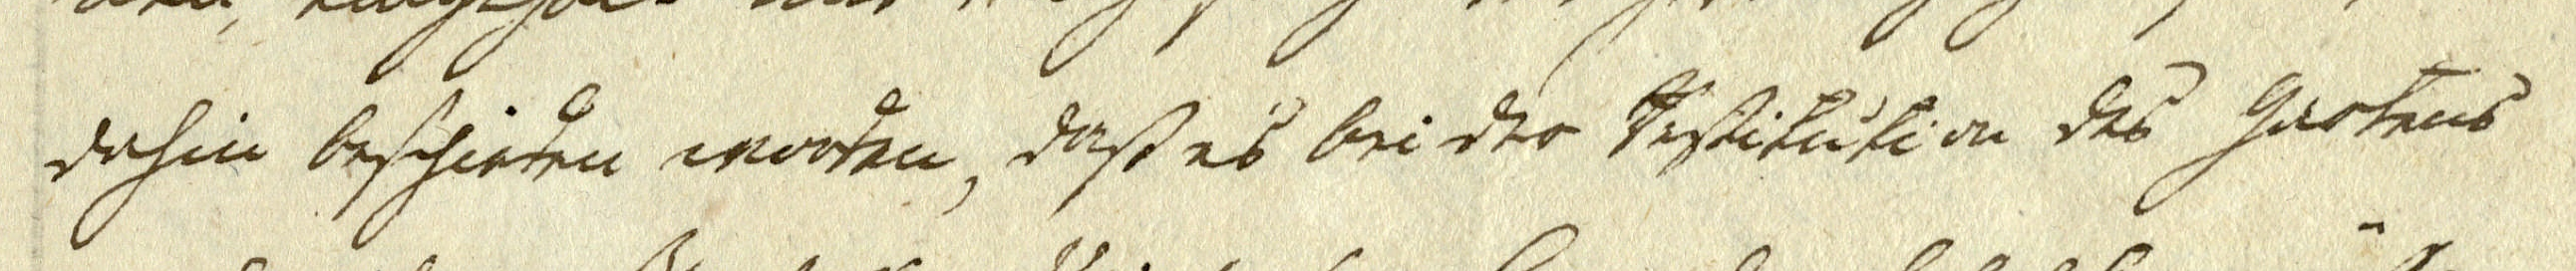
dahin beschieden worden, daß es bei der Restitution des Gartens
